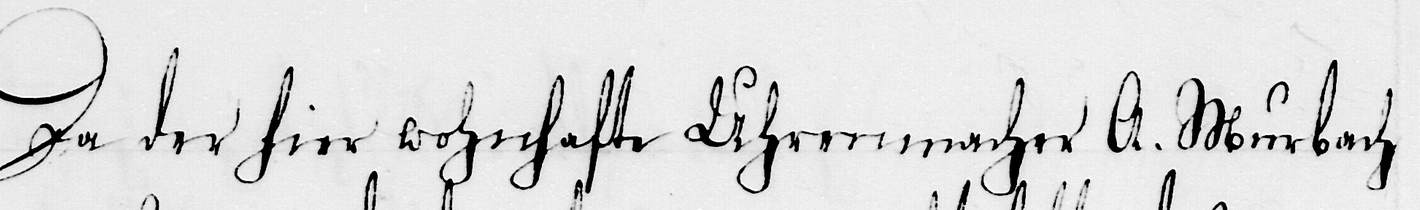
Da der hier wohnhafte Uhrenmacher A. Murbach
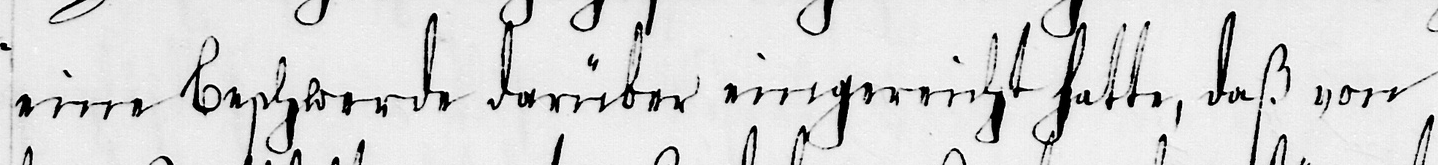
eine Beschwerde darüber eingereicht hatte, daß von
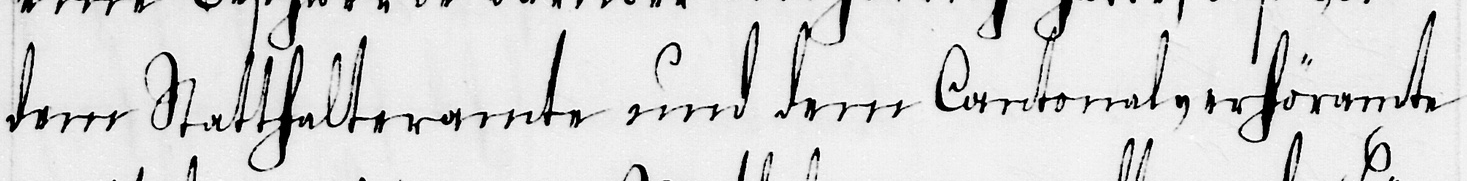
dem Statthalteramte und dem Cantonalverhöramte
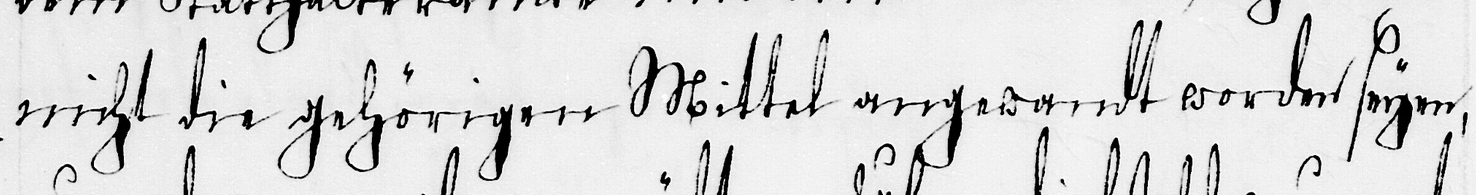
nicht die gehörigen Mittel angewandt worden seyen,
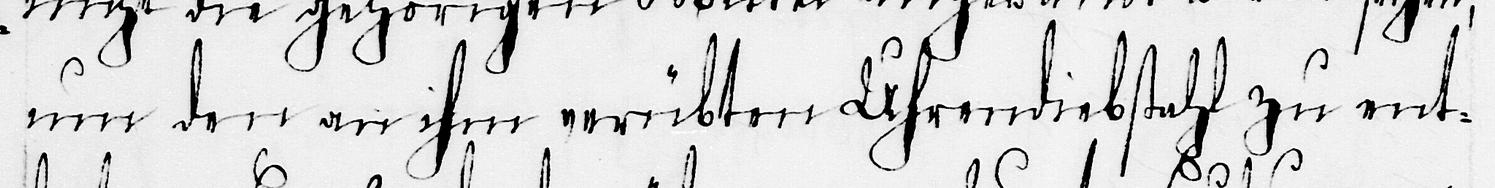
um den an ihm verübten Uhrendiebstahl zu ent¬
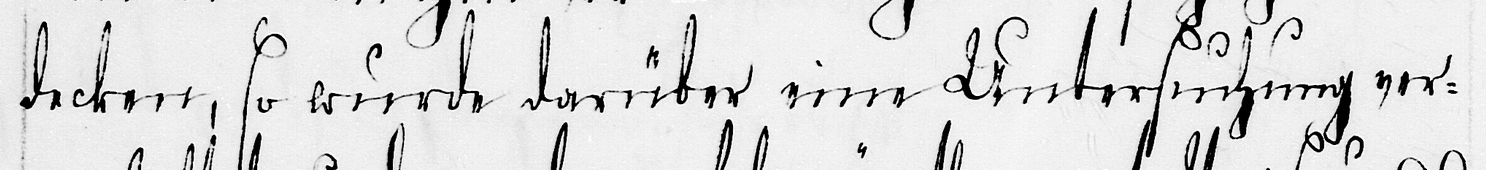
decken, so wurde darüber eine Untersuchung ver¬
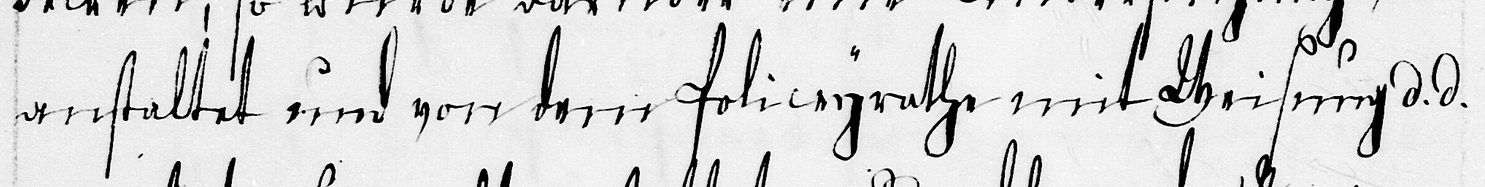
anstaltet und von dem Policeyrathe mit Weisung d. d.
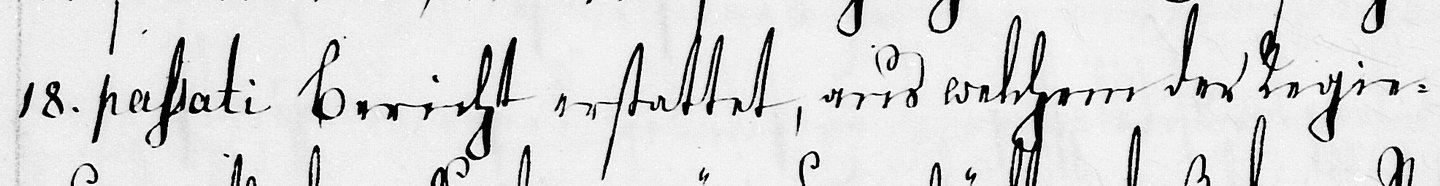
18. passati Bericht erstattet, aus welchem der Regie¬
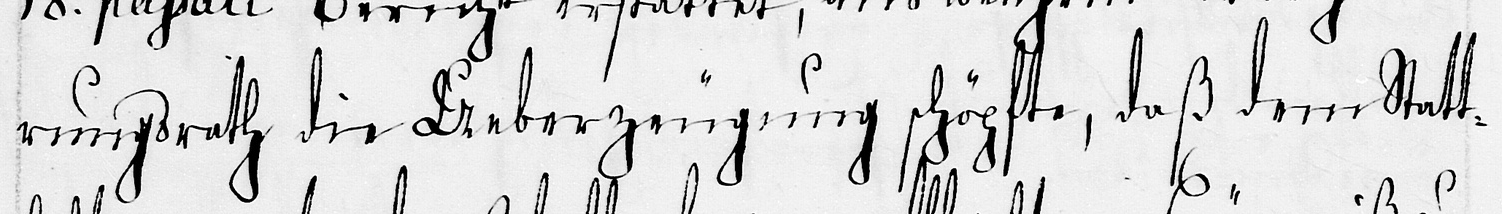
rungsrath die Ueberzeugung schöpfte, daß dem Stat¬
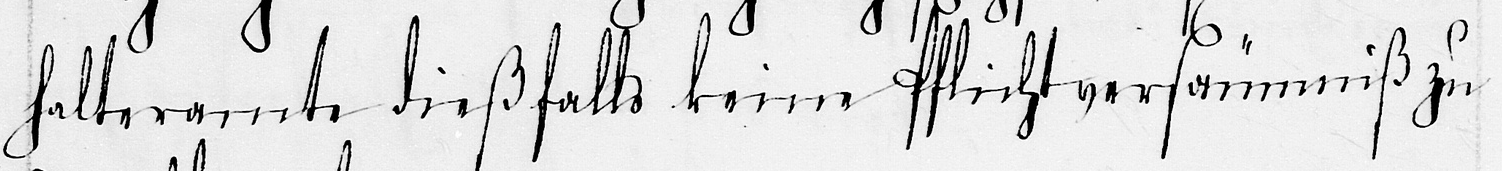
thalteramte dießfalls keine Pflichtversäumniß zu
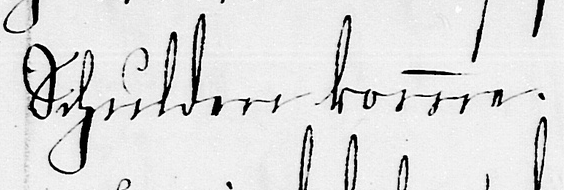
Schulden komme.
